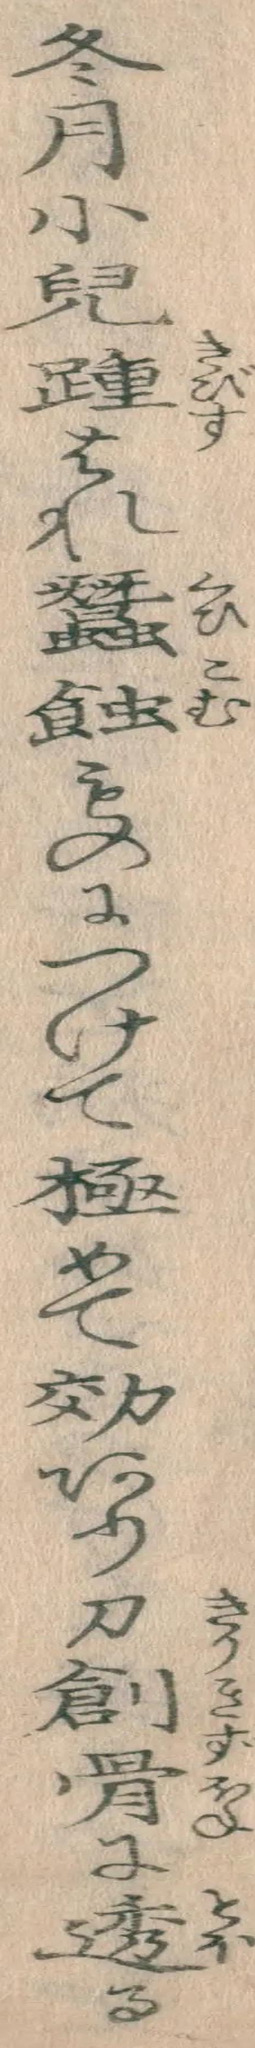冬月小児踵はれ蠶蝕ものにつけて極めて効あり刀創骨に透る
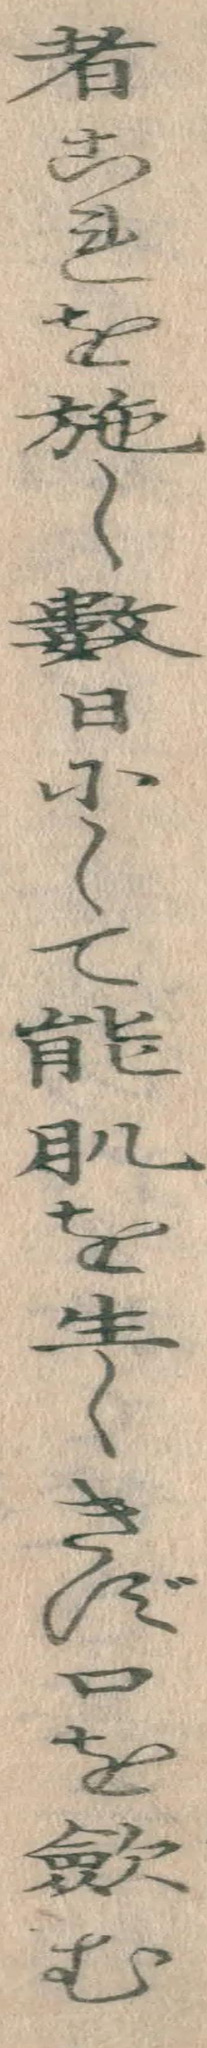者これを施し数日にして能肌を生しきず口を歛む
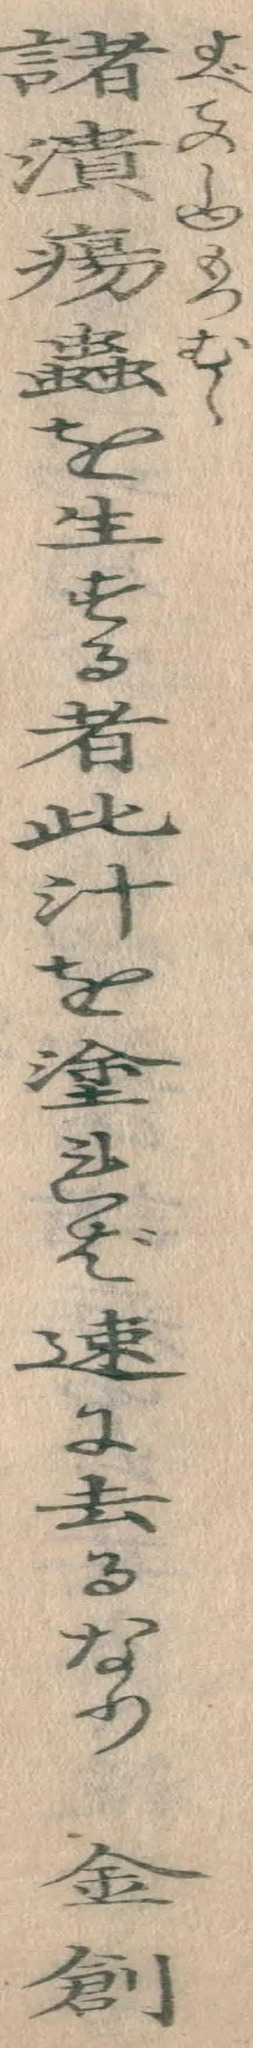諸潰瘍虫を生する者此汁を塗れば速に去るなり金創
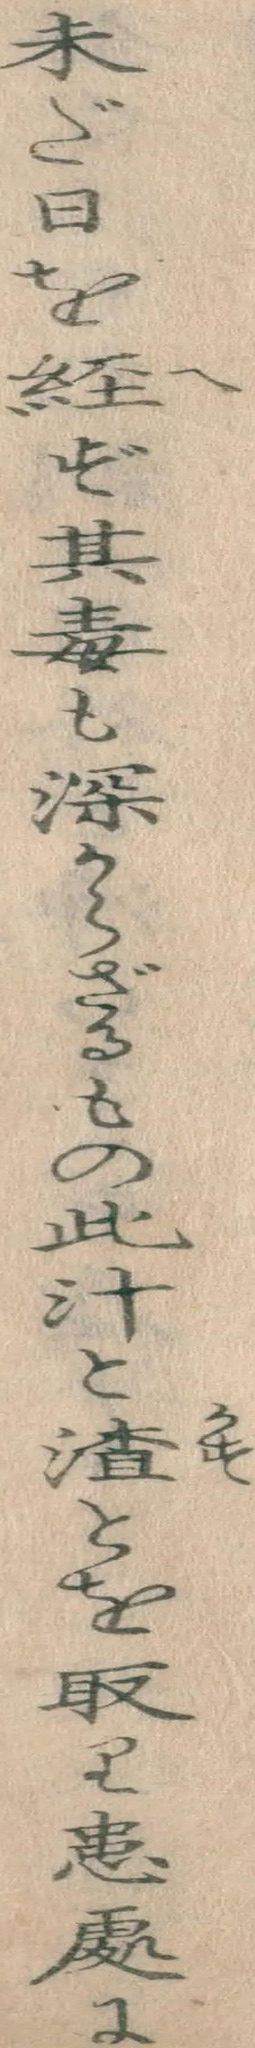未だ日を経ず其毒も深からざるもの此汁と渣とを取り患処に
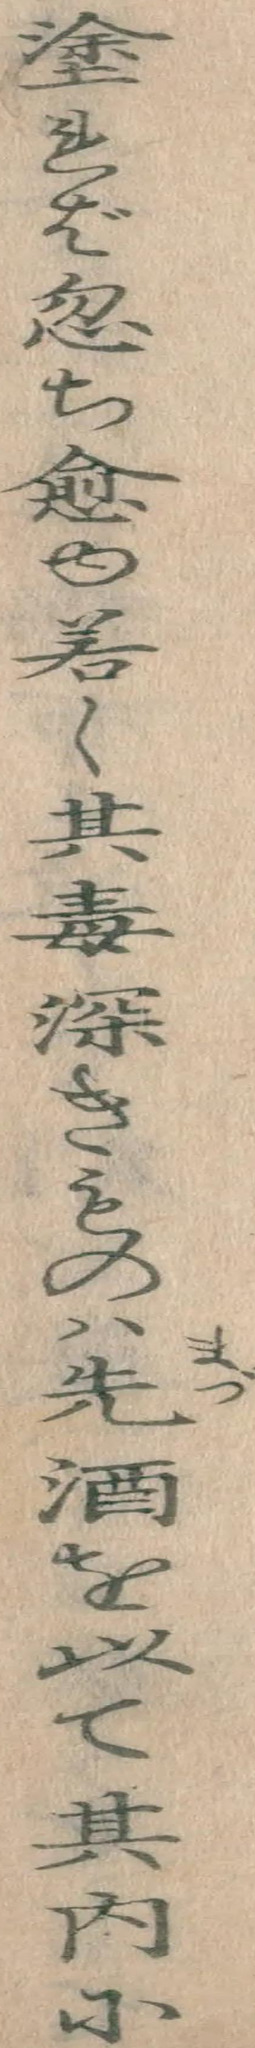塗れば忽ち愈ゆ若し其毒深きものは先酒を以て其内に

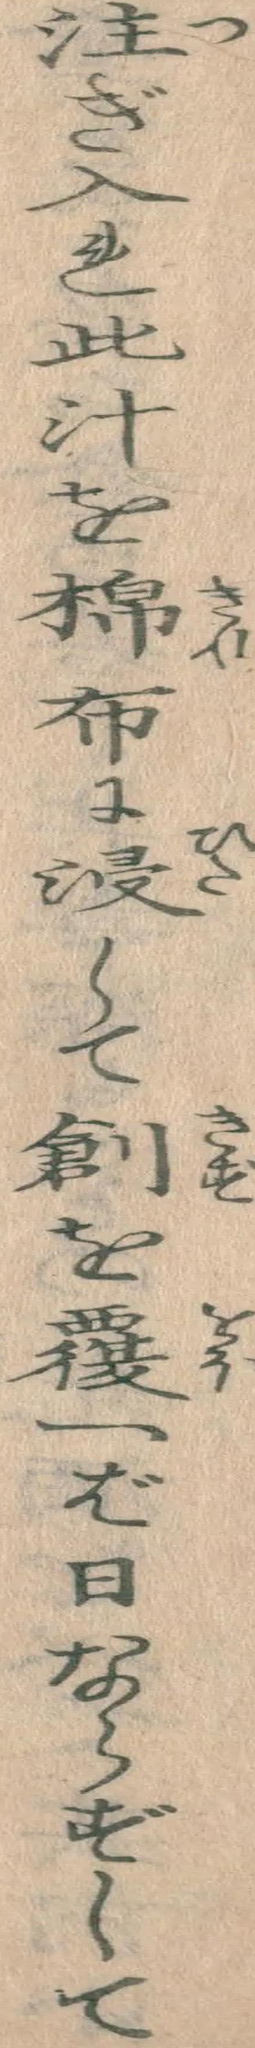注ぎ入れ此汁を棉布に浸して創を覆へば日ならずして
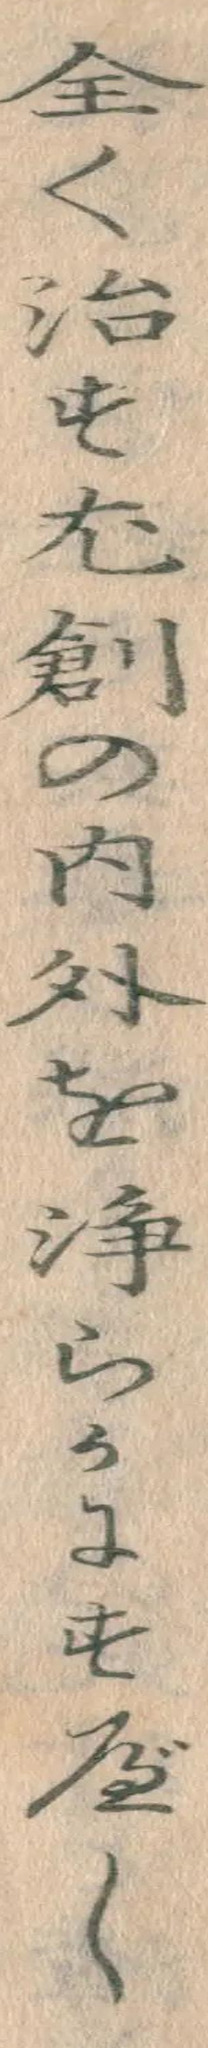全く治す尤創の内外を浄らかにすべし
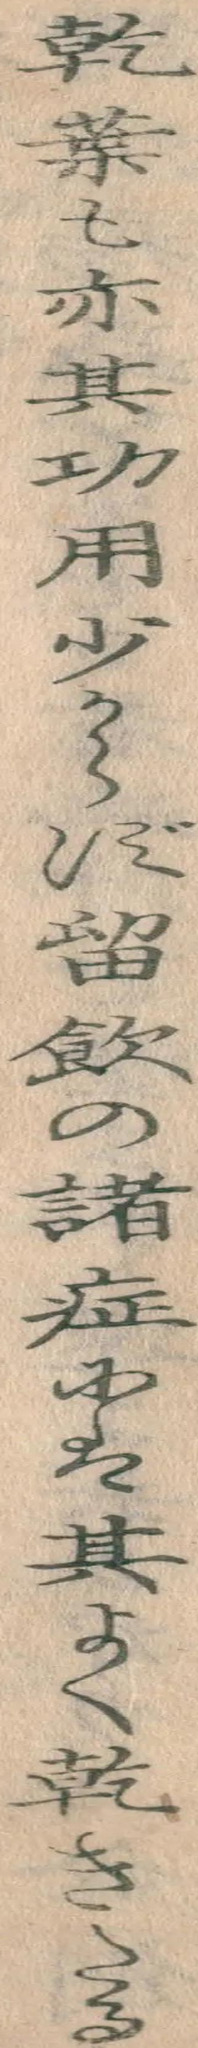乾葉も亦其功用少からず留飲の諸症には其よく乾きたる
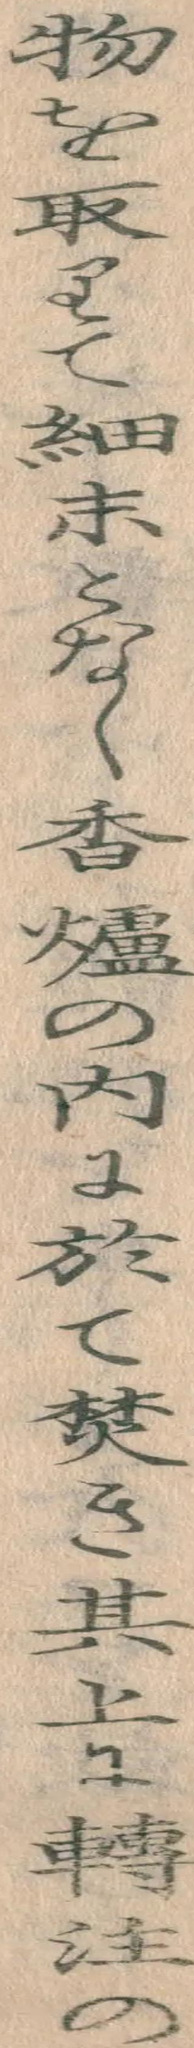物を取りて細末となし香炉の内に於て焚き其上に転注の
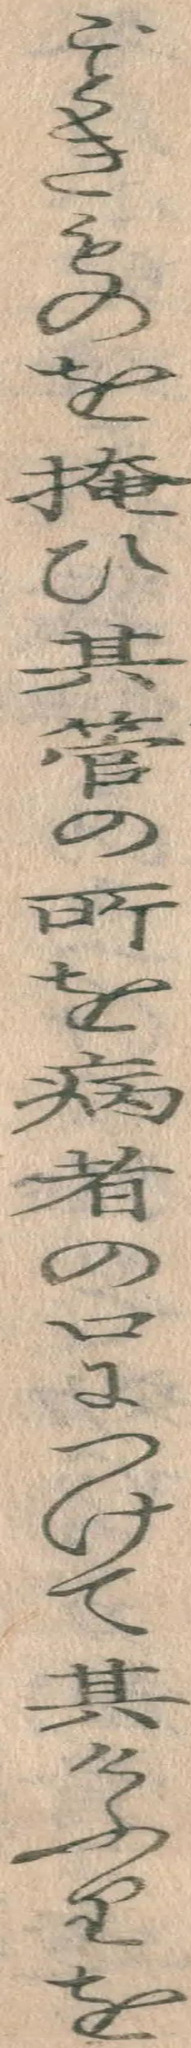ごときものを掩ひ其管の所を病者のくちにつけて其けふりを
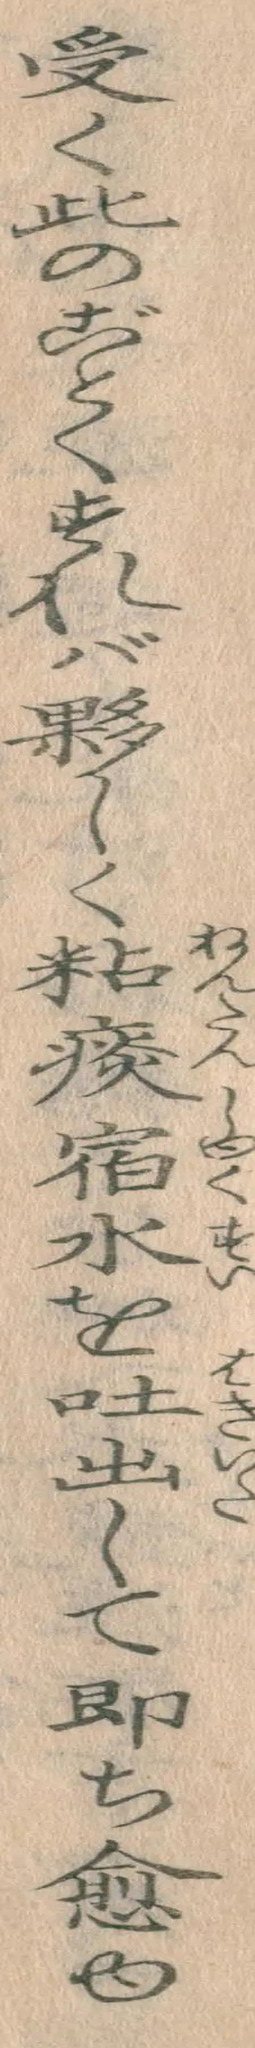受く此のごとくすれば夥しく粘痰宿水を吐出して即ち愈ゆ
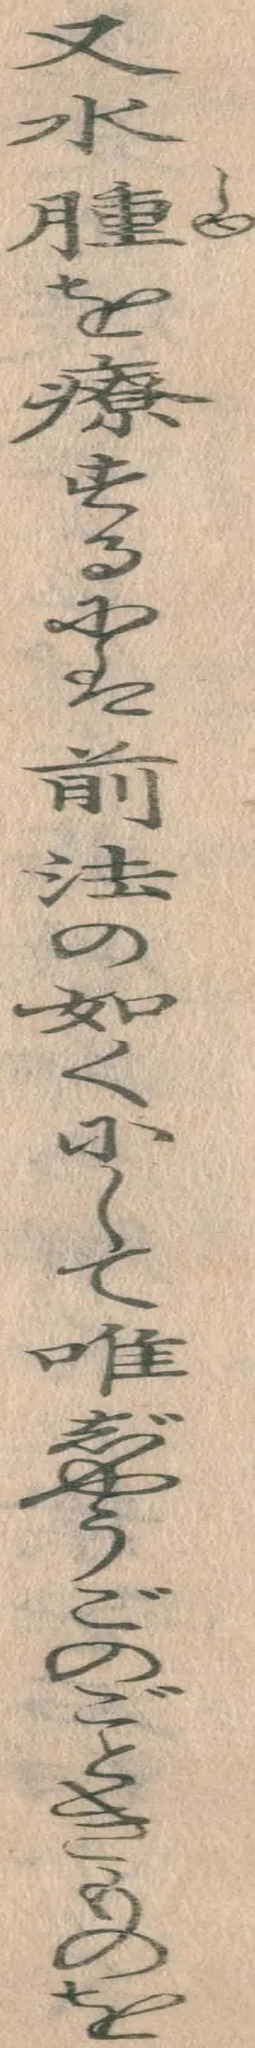又水腫を療するには前法の如くにして唯じやうごのごときものを
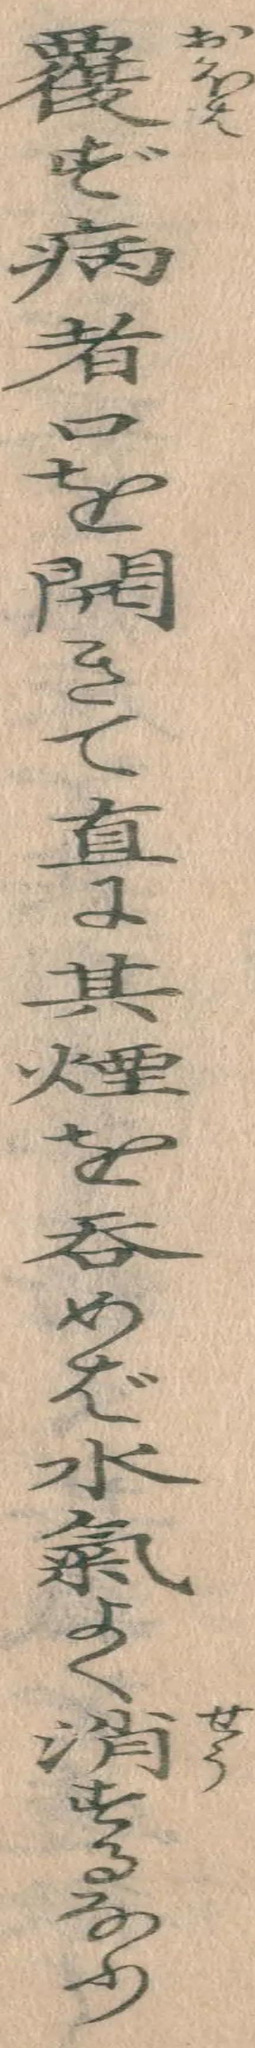覆ず病者口を開きて直に其煙を呑めば水気よく消するなり
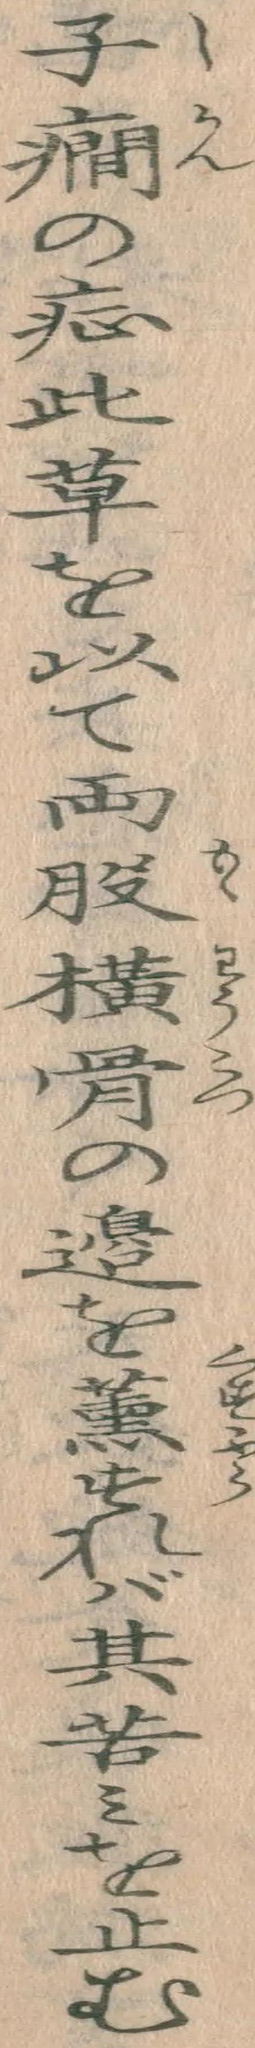子癇の症此草を以て両股横骨の辺を薫すれば其苦みを止む
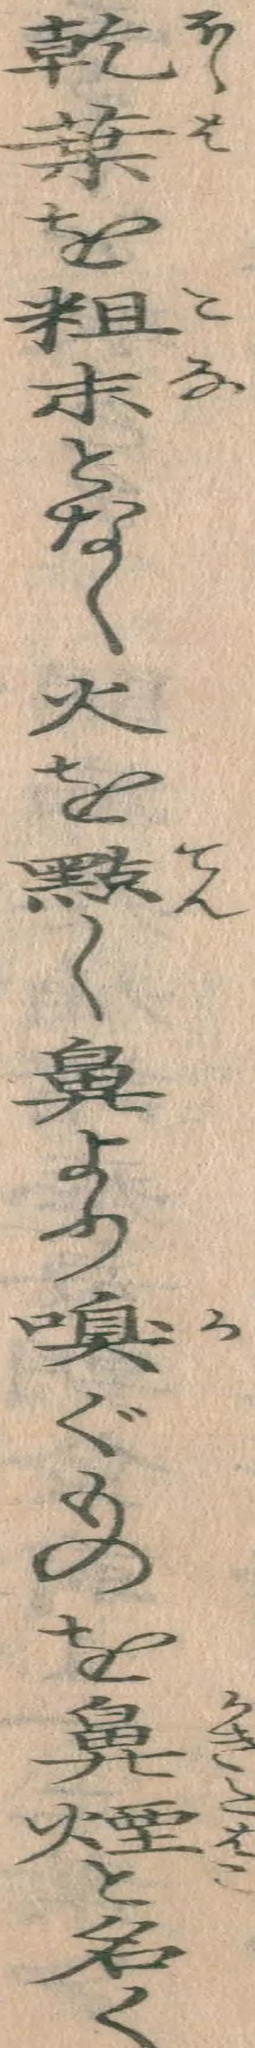乾葉を粗末となし火を点し鼻より嗅ぐものを鼻煙と名く
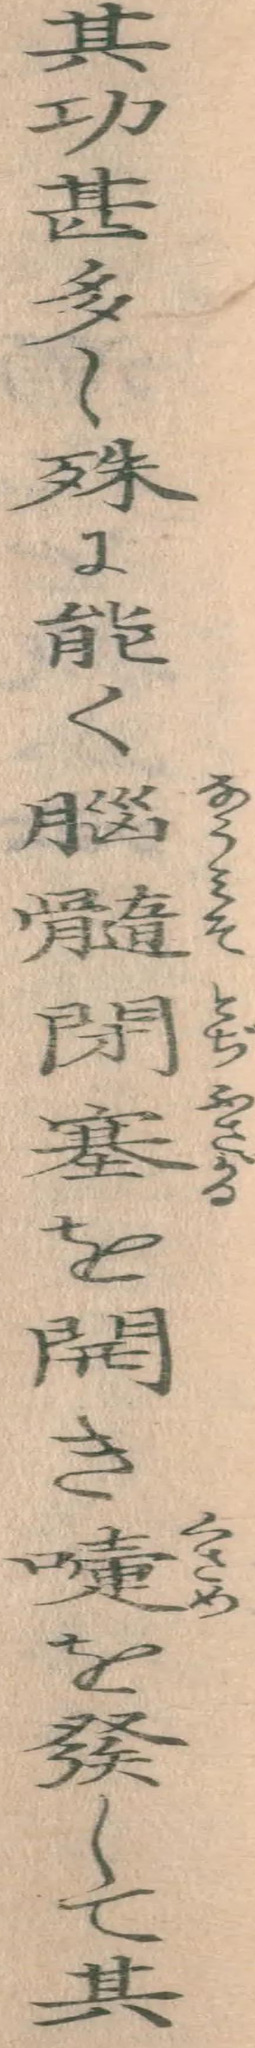其功甚多し殊に能く脳髄閉塞を開き嚏を発して其
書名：目さまし草
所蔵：国立国会図書館 National Diet Library, JAPAN
